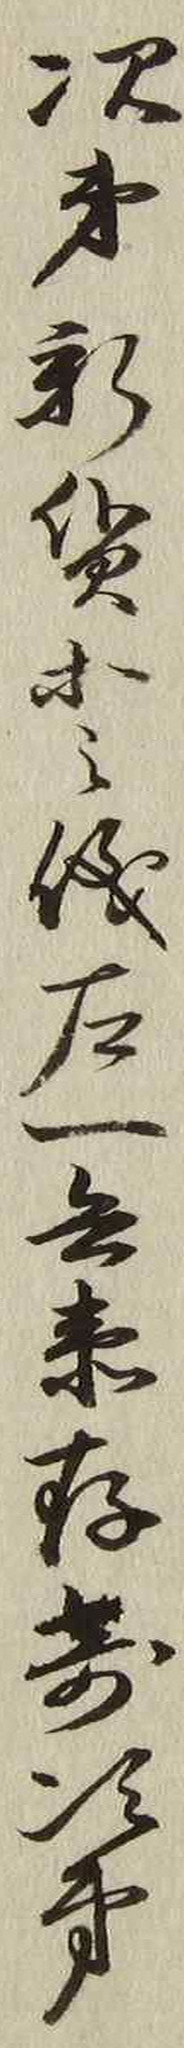次第新質等之儀左一兵衛存寄次第
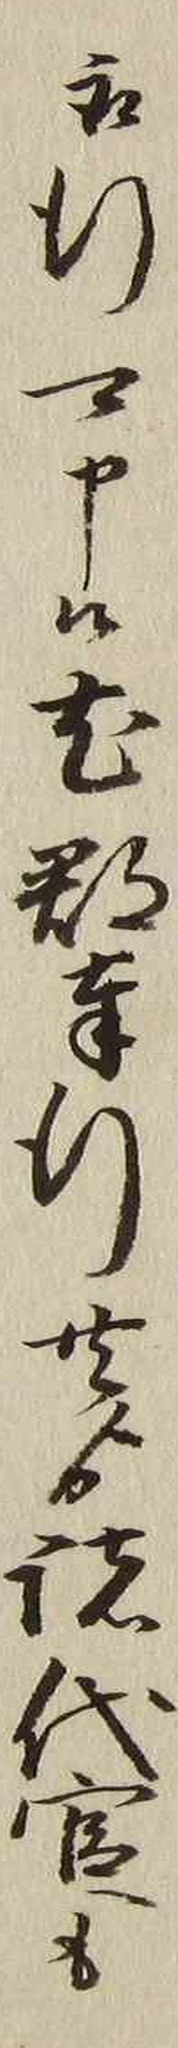取行可申候尤郡奉行共ゟ諸代官へも
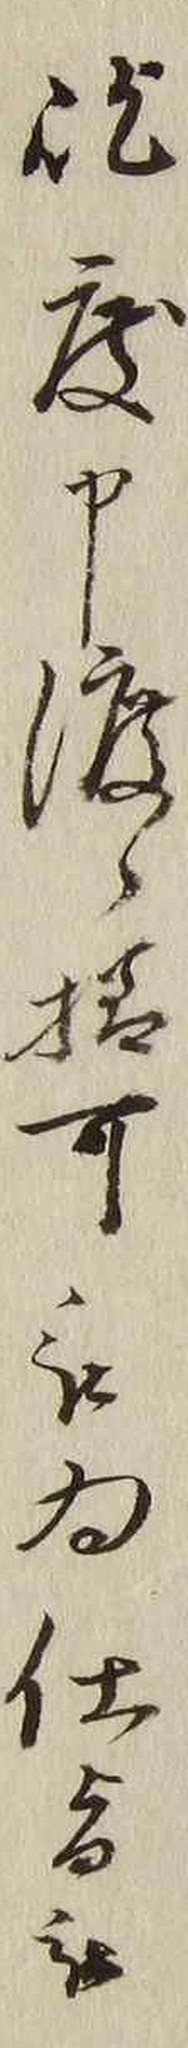屹度申渡候様可被為仕旨被
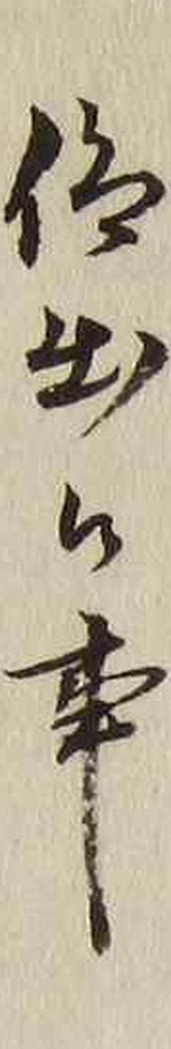仰出候事
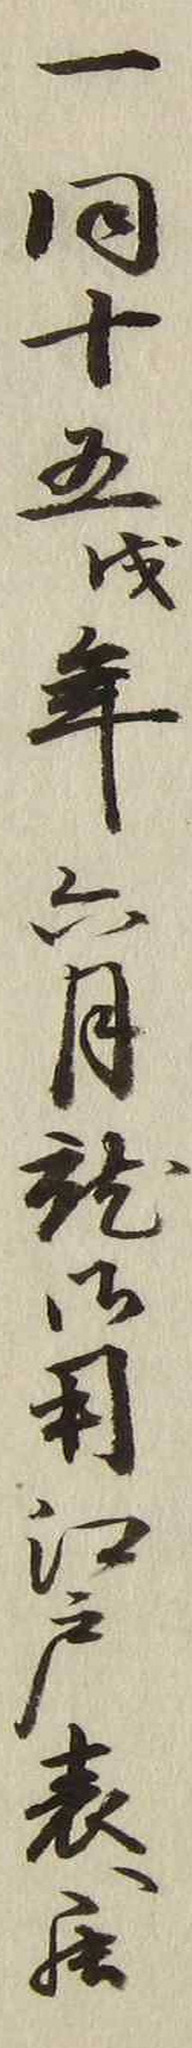一同十五戌年六月就御用江戸表へ罷
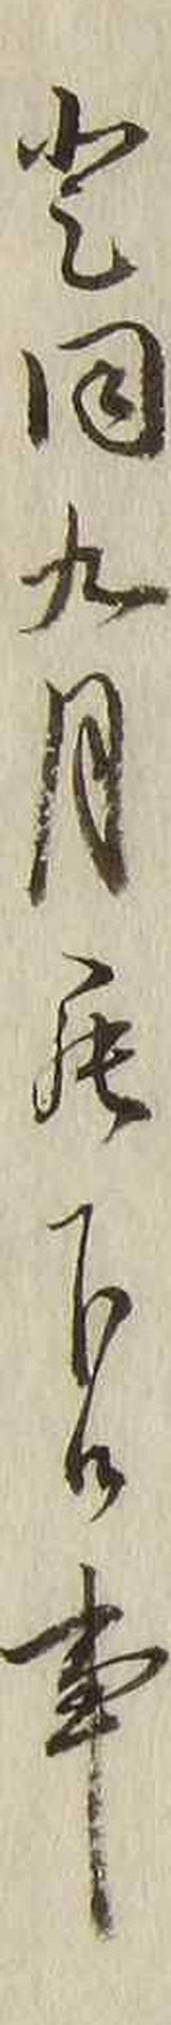登同九月罷下候事

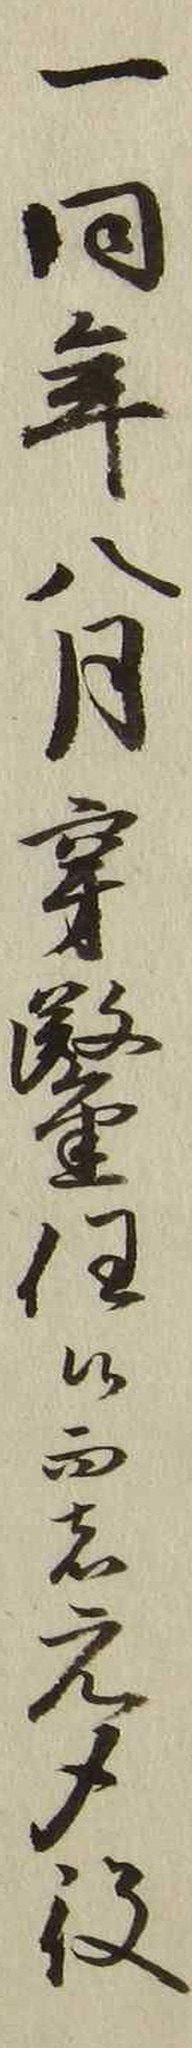一同年八月穿鑿任候而者元〆役
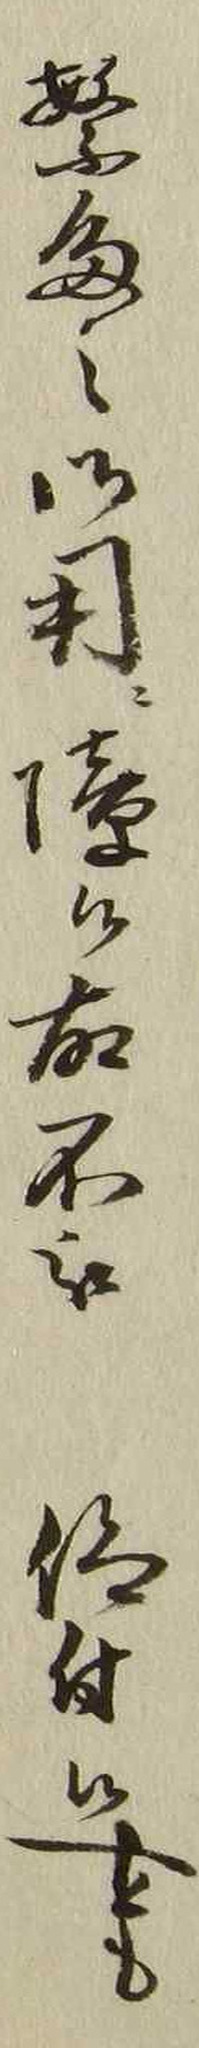繁多之御用ニ障候故不被仰付候へとも
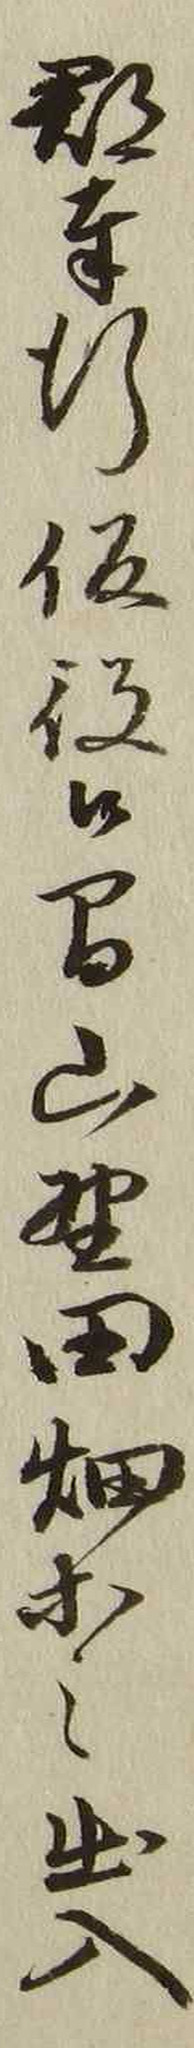郡奉行仮役候間山野田畑等之出入
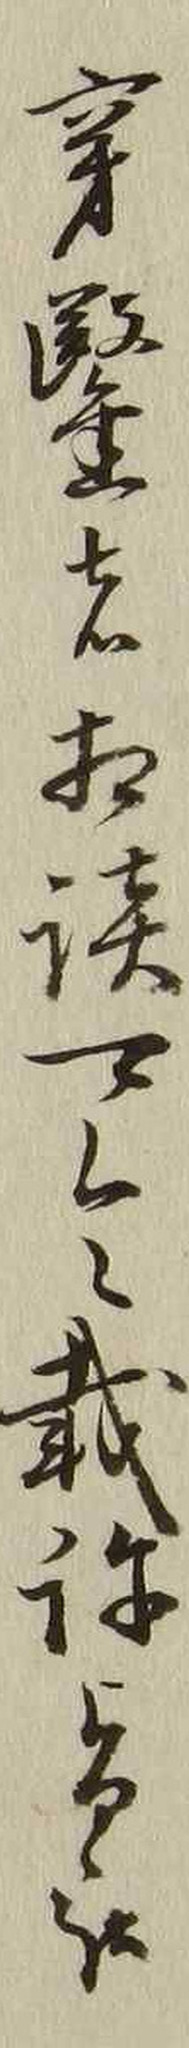穿鑿者相談可令載許旨被
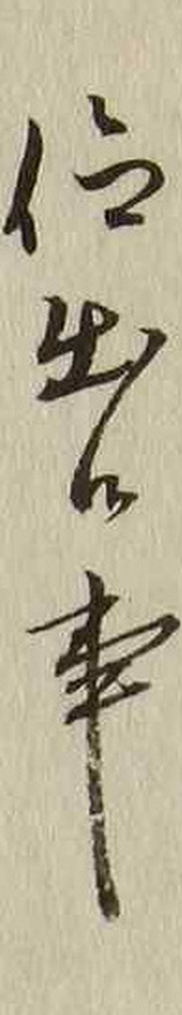仰出候事
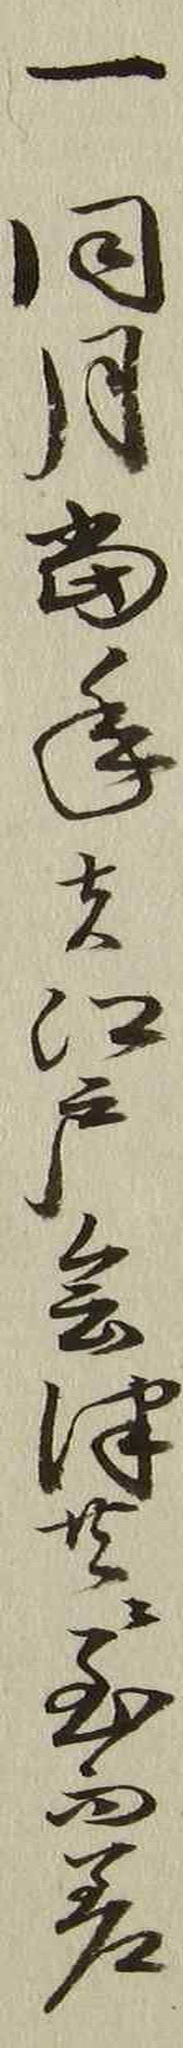一同月当年者江戸会津共ニ至而差
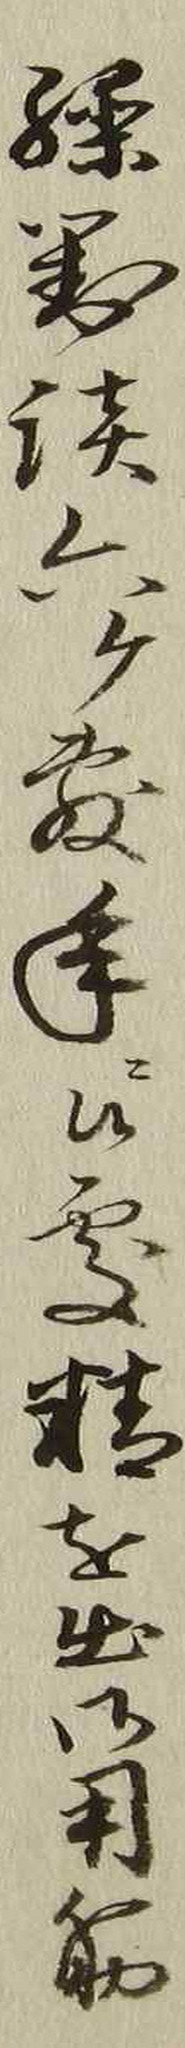繰万談六ヶ敷年二候処精を出御用筋
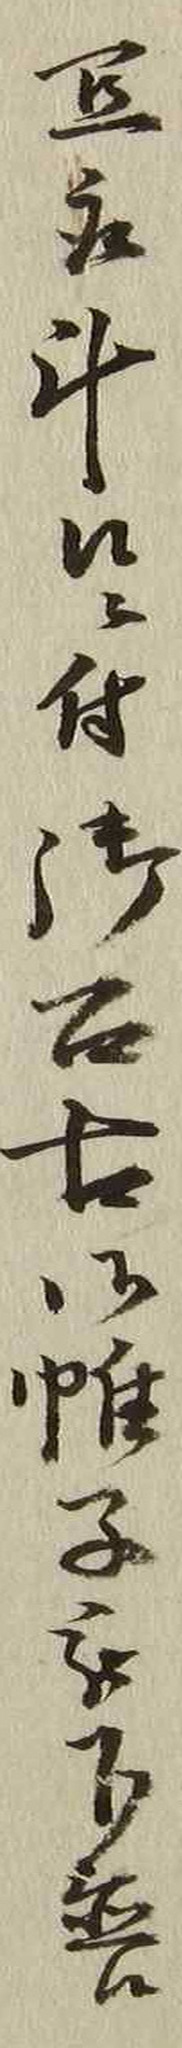宜取計候ニ付御召古御帷子被下置候
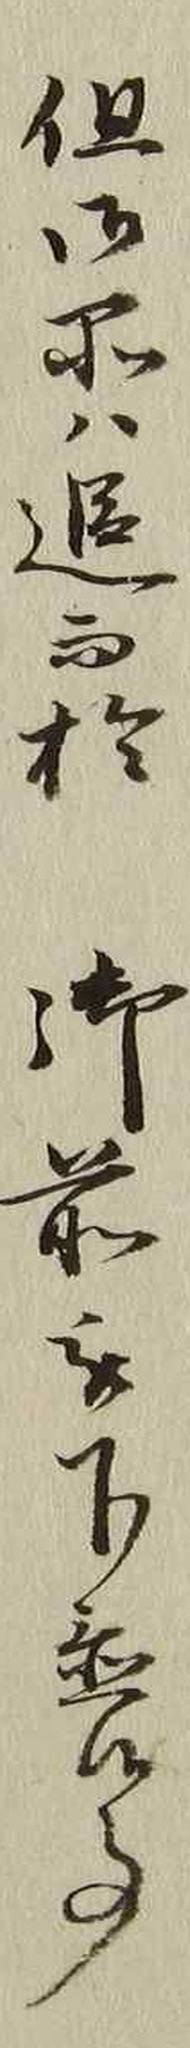但御品ハ追而於御前被下置候事
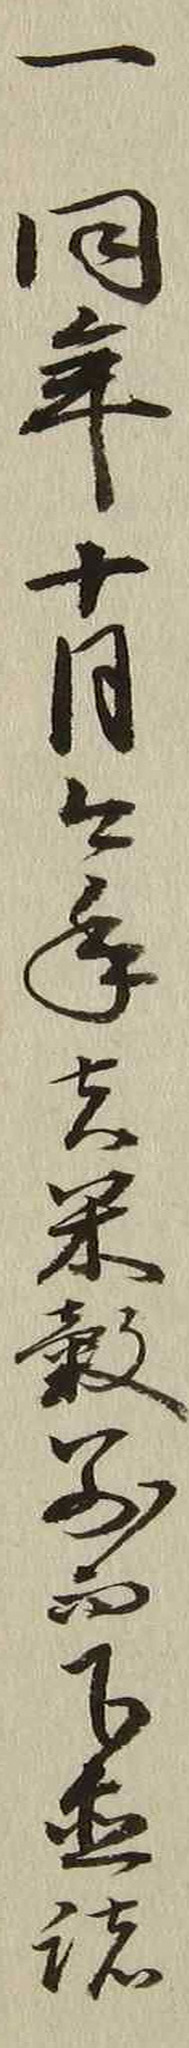一同年十月今年者米穀別而下置諸
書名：諸士系譜　巻之61　と之部4
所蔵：会津若松市立会津図書館
